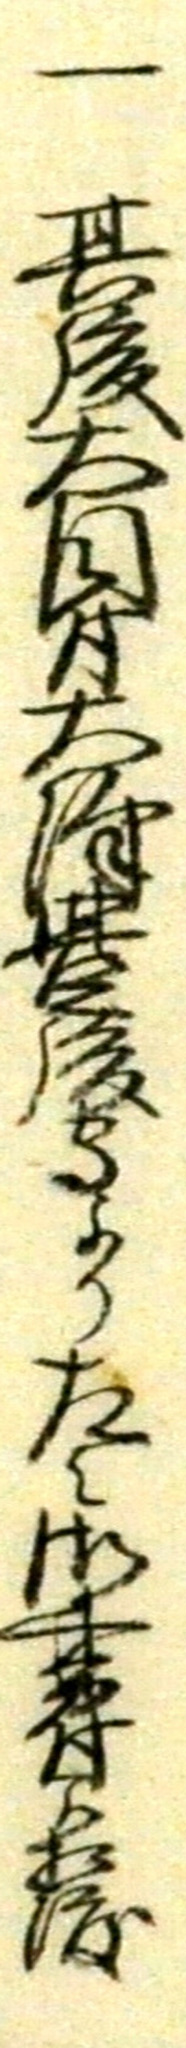一其後大目付大澤豊後守より左之御書付被相渡
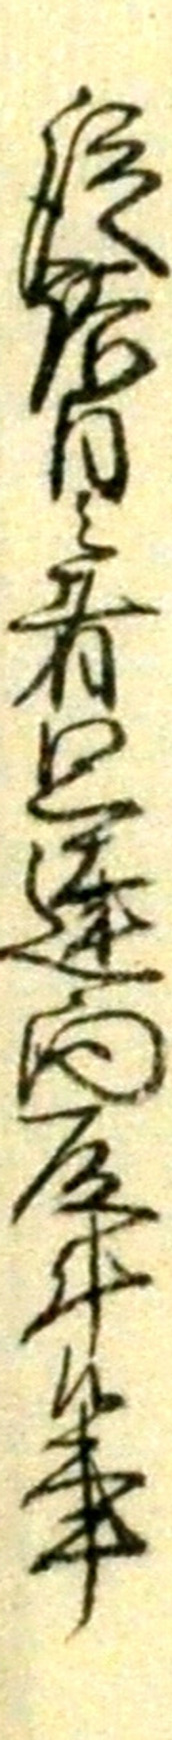従詰日之者廻達向殿計候事
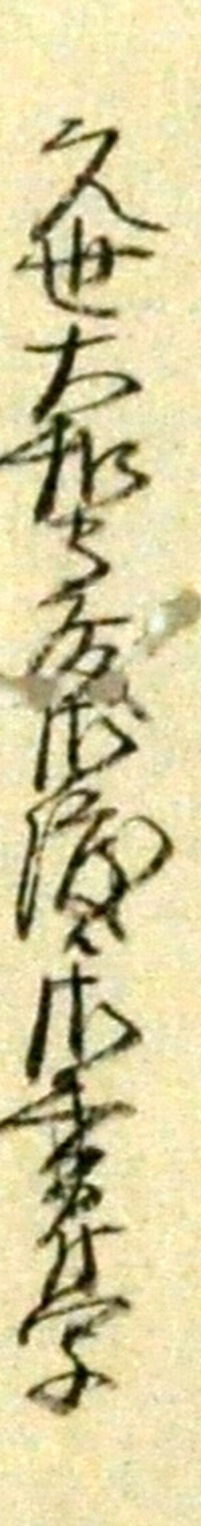久世大和守殿御渡候御書付写
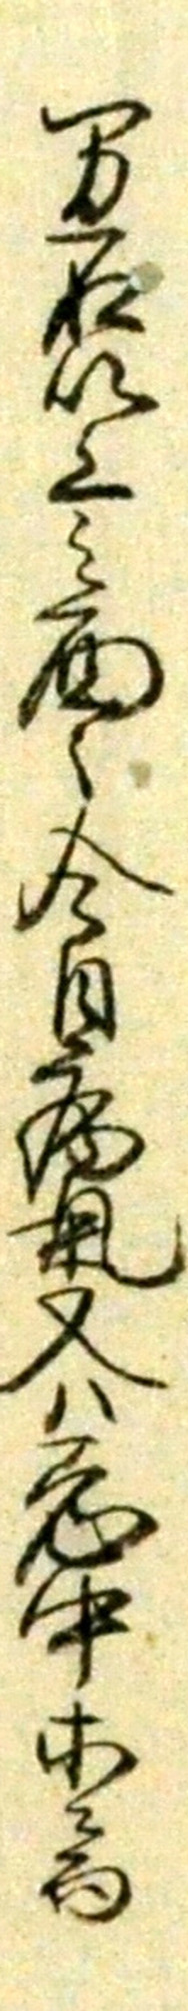万石以上之面々今日病気又ハ忌中等ニ而
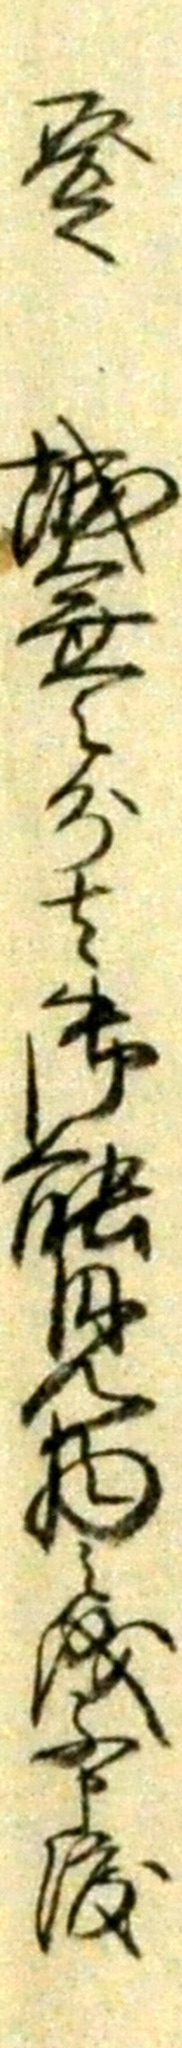登城無之分は御能見物之儀不申渡
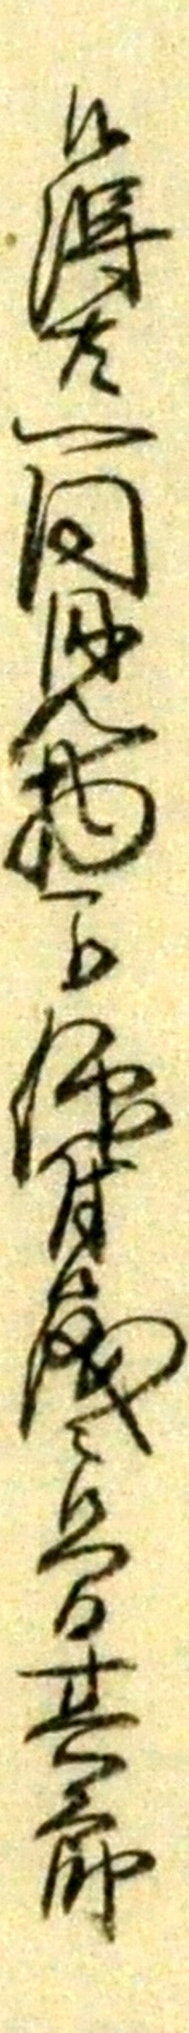候得共一同見物被仰付候儀ニ候間其節
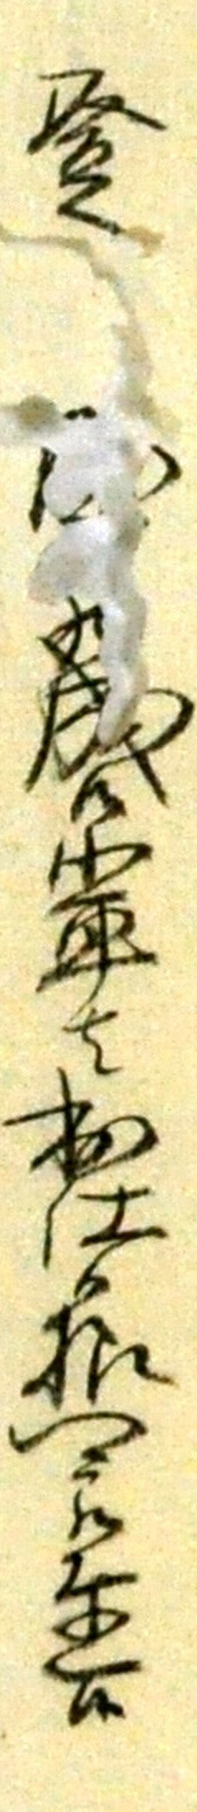登城成候輩は出仕候様可被達候
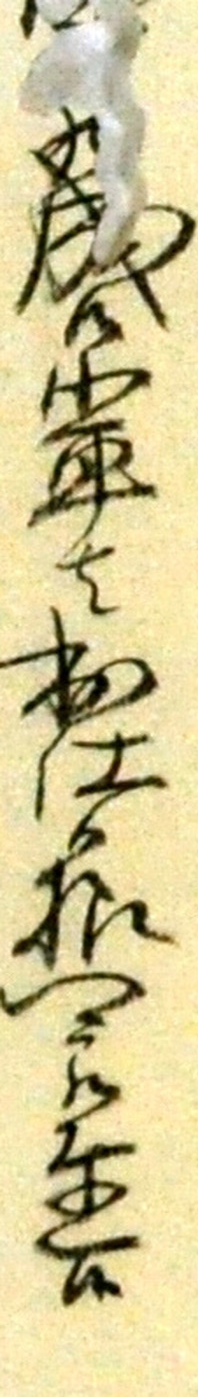登城成候輩は出仕候様可被達候
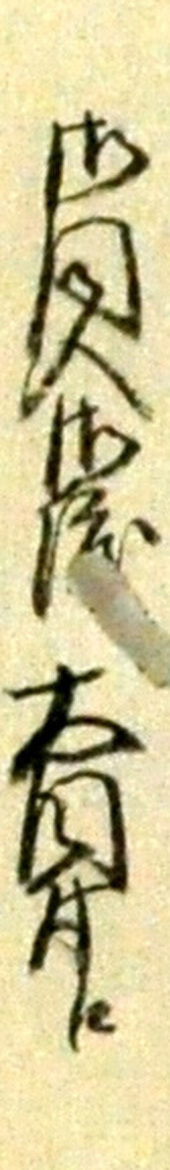御同人御渡大目付え
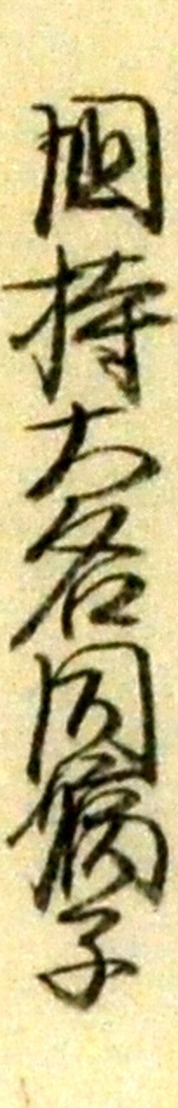国持大名同嫡子
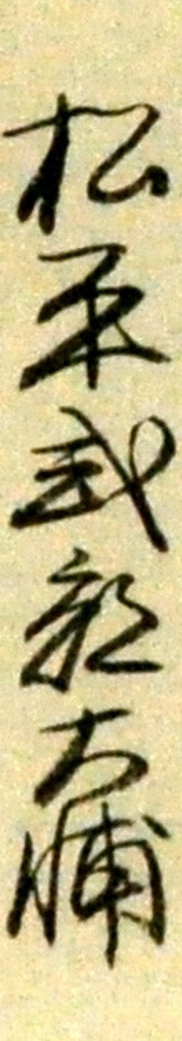松平式部大輔
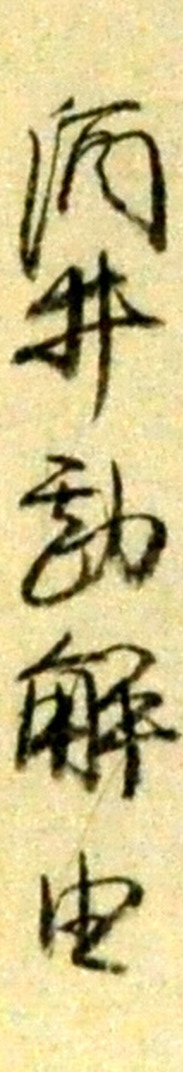酒井勘解由
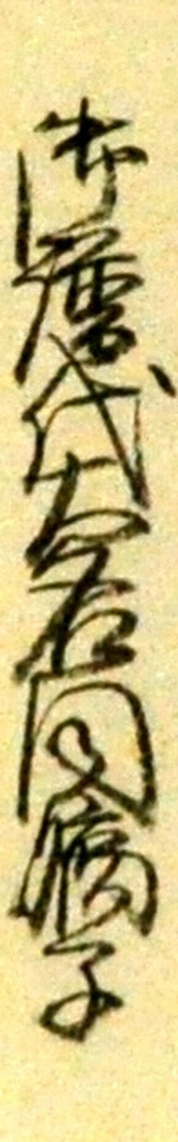御譜代大名同嫡子
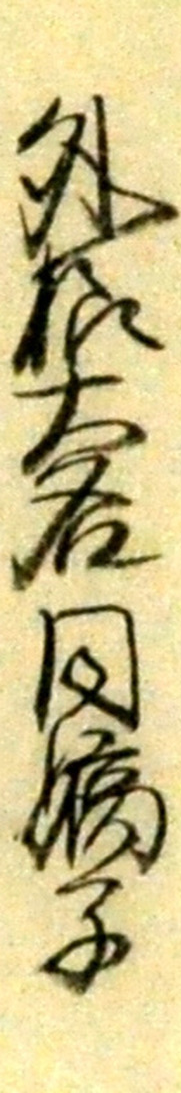外様大名同嫡子
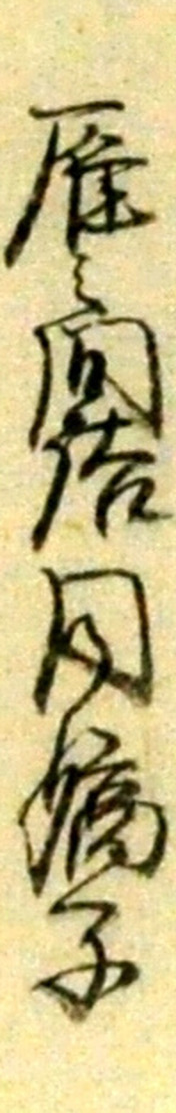雁之間詰同嫡子
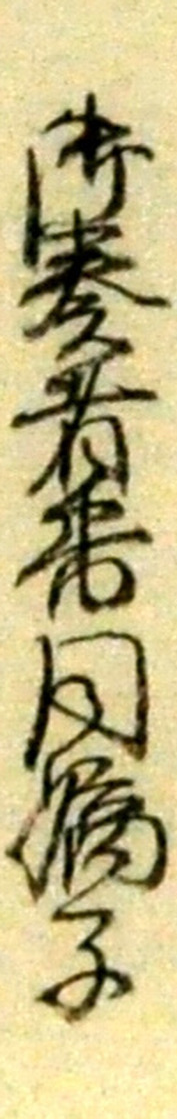御奏者番同嫡子
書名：御移徒相済御祝儀御能ノ節ノ留外
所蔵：伊那市立高遠町図書館・合同会社AMANE
